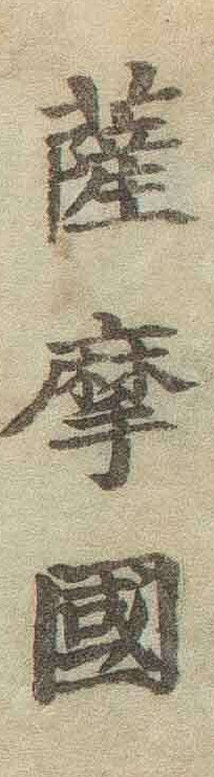薩摩国

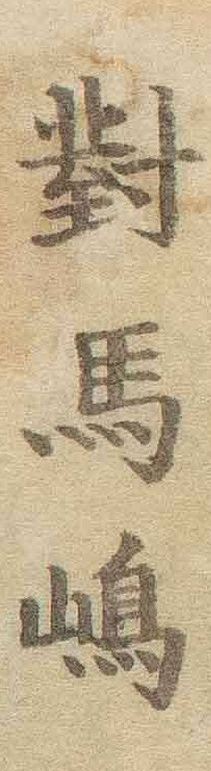対馬島

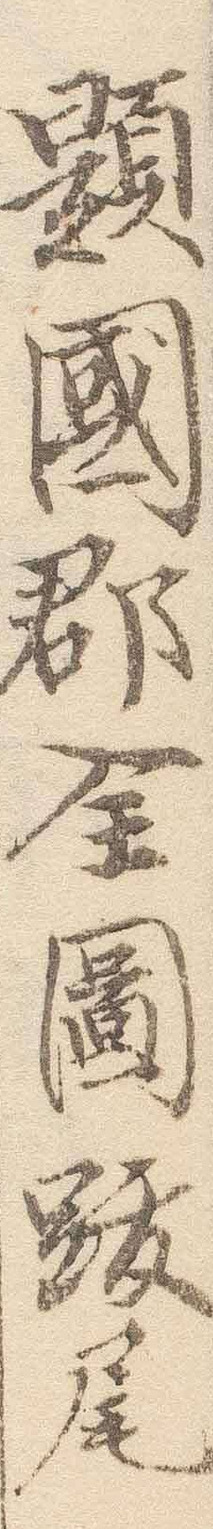題国郡全図跋尾
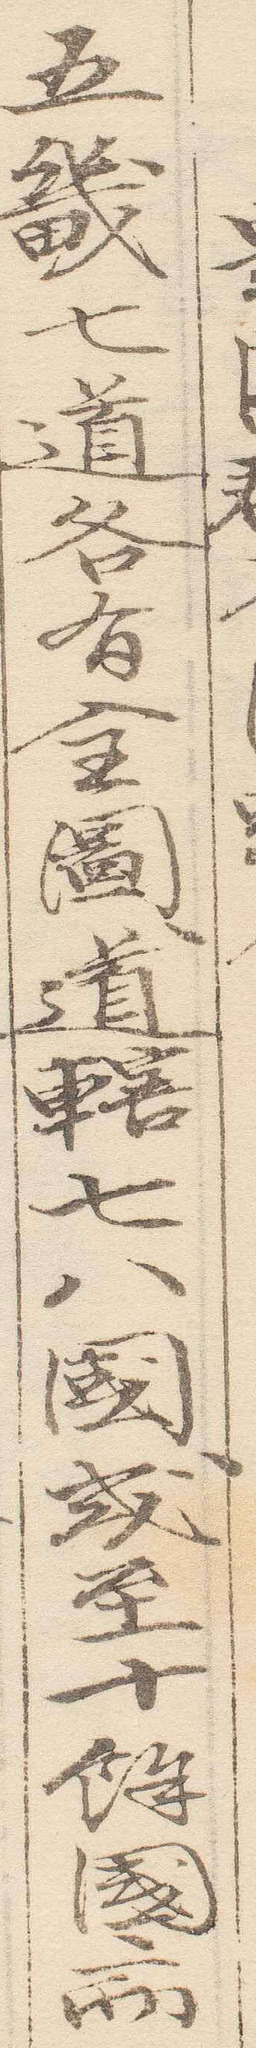五畿七道各有全国、道轄七八国、或至十余国、一而
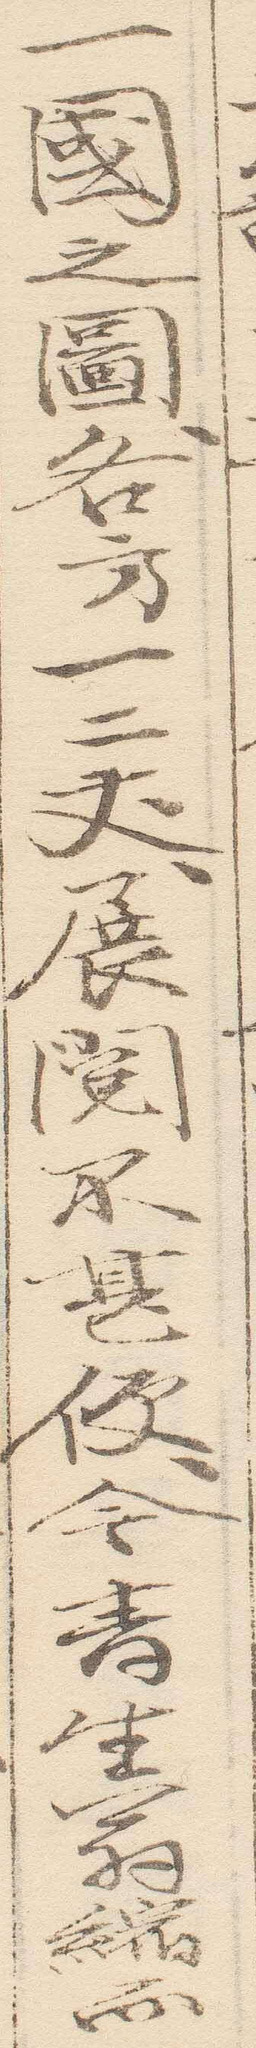一国之図、各方一二丈、展閲不甚便、今青生翁縮而
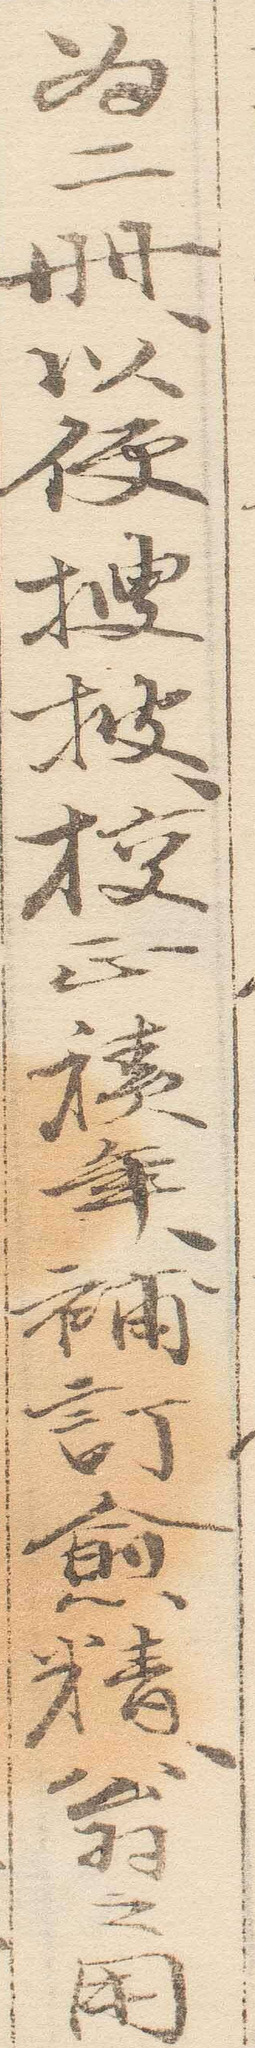為二冊、以便捜披、校正積年、補訂愈精、翁之用
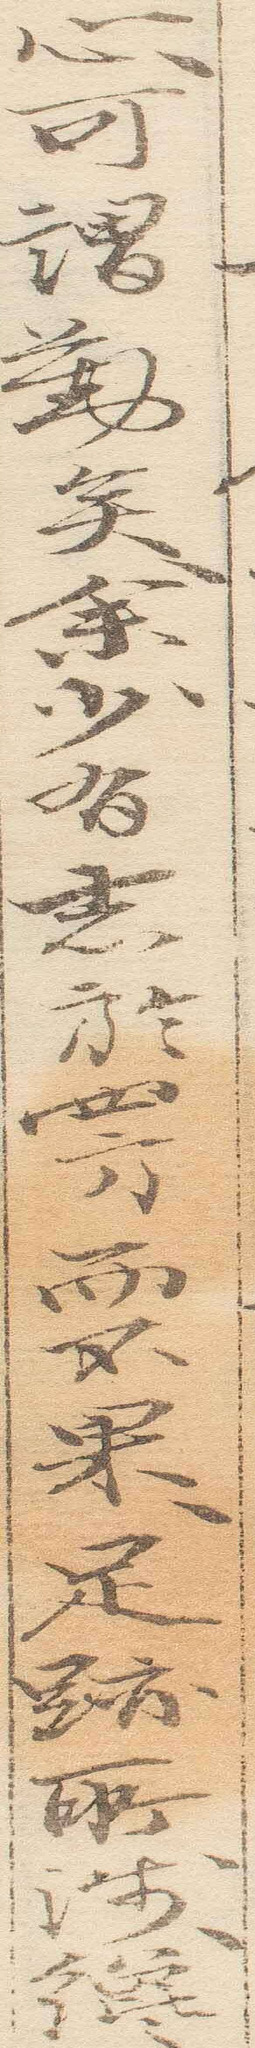心、可謂勤矣、余少有志於四方而不果、足跡所渉、纔
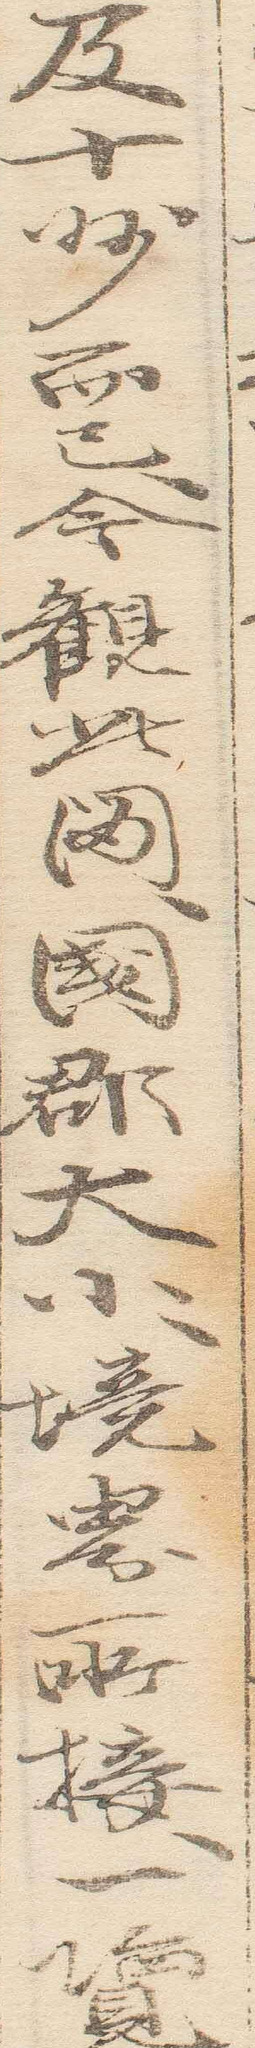及十州而已、今観此図、国郡大小、境界所接、一覧
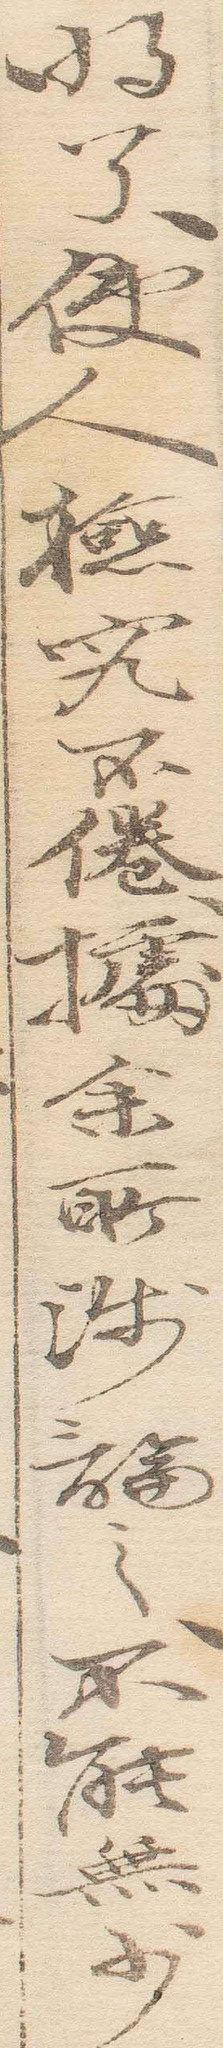将了、使人検究不倦、拠余所渉論之、不能無少
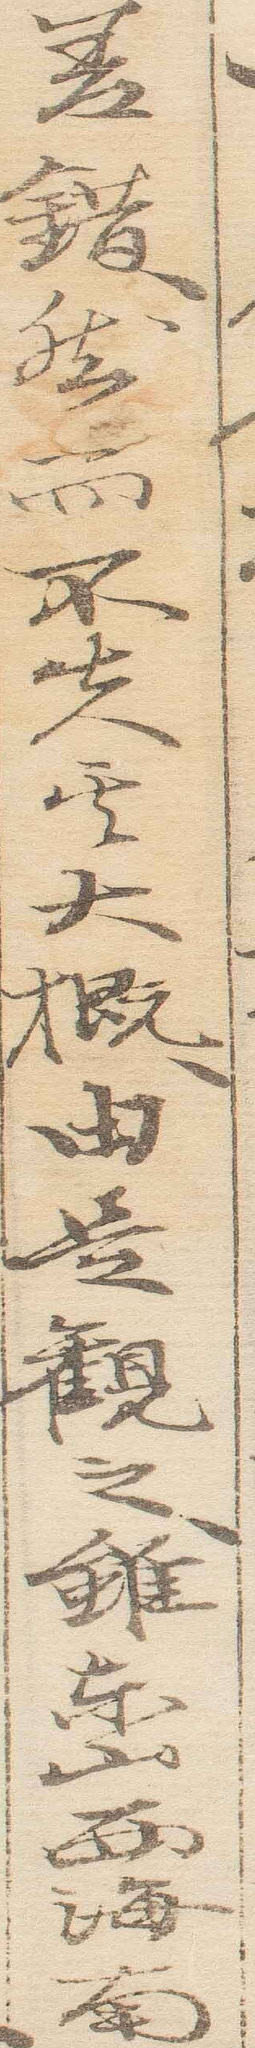差錯、然而不失其大概、由是観之、雖東山西海南
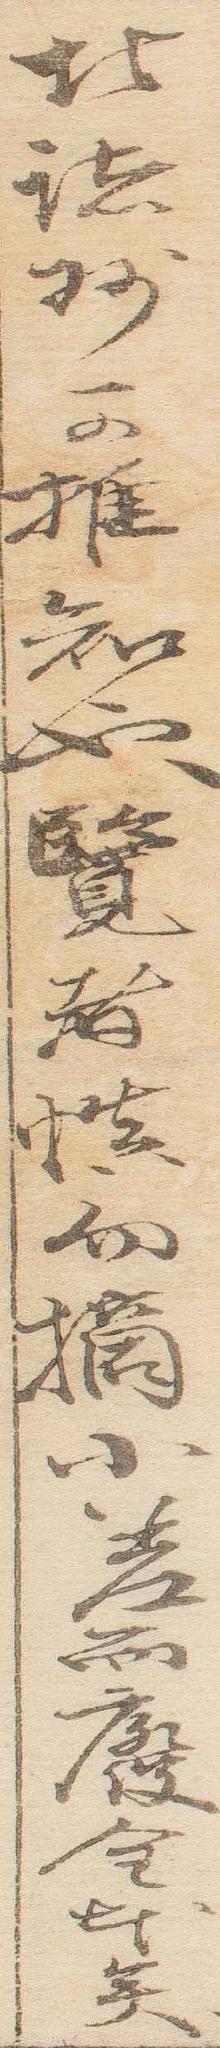北諸州可推知也、覧者慎而摘小差而廃全本矣、
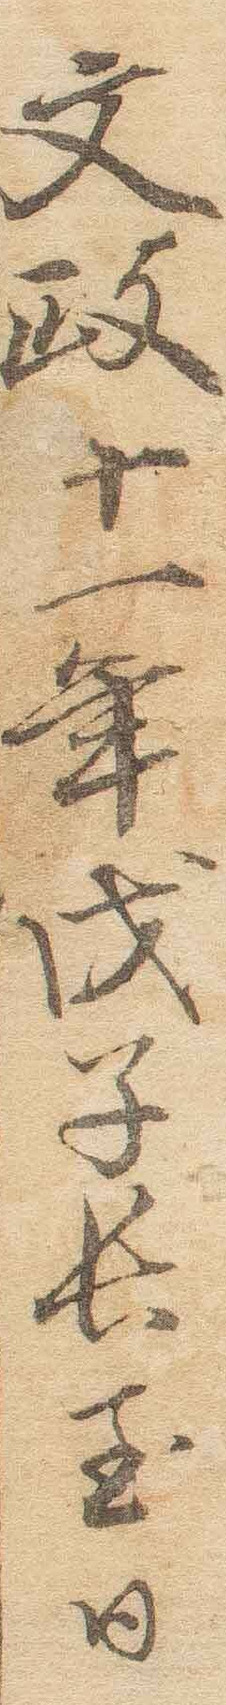文政十一年戊子長玉日

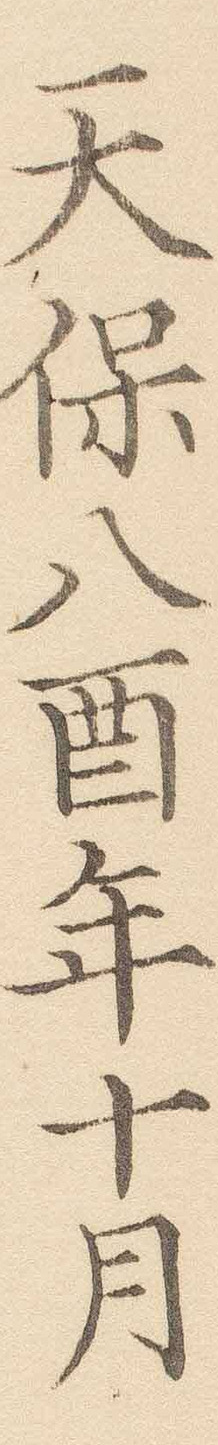天保八酉年十月
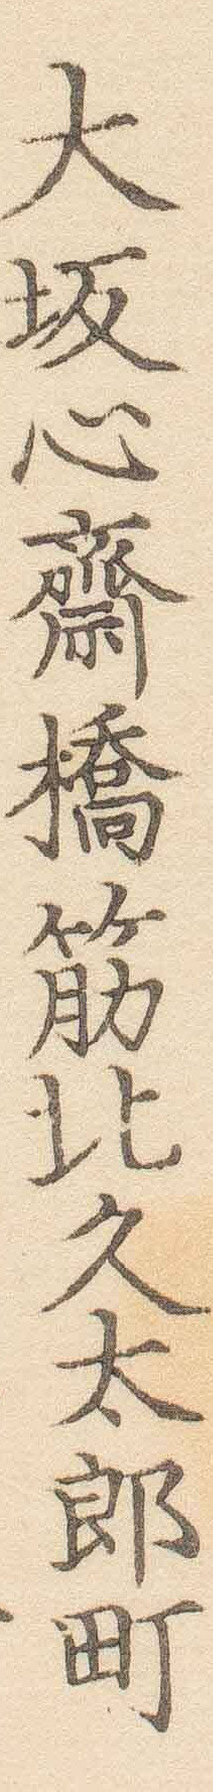大坂心斎橋筋北久太郎町
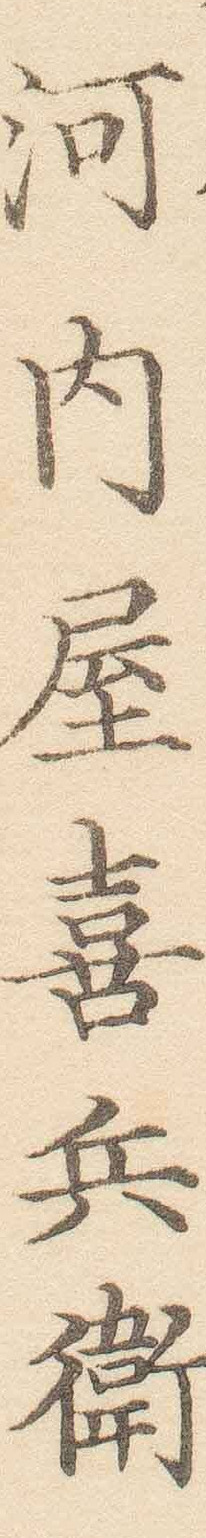河内屋喜兵衛
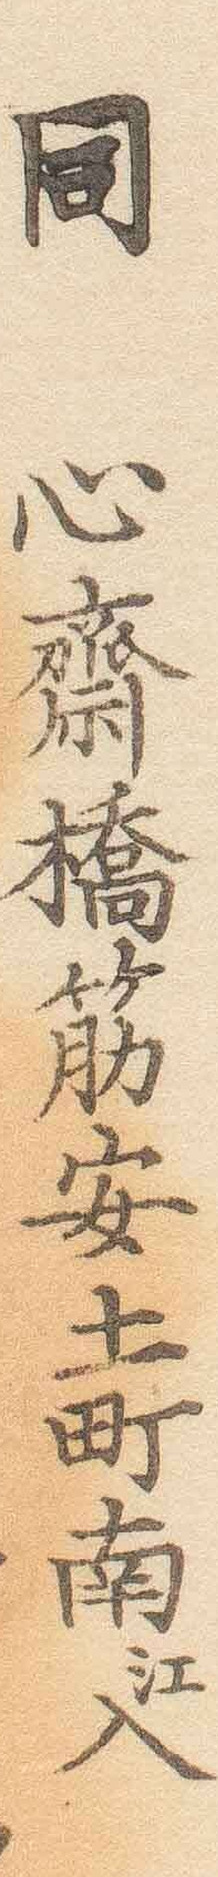同心斎橋筋安土町南江入
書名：国郡全図
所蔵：東京学芸大学附属図書館 国文学研究資料館
